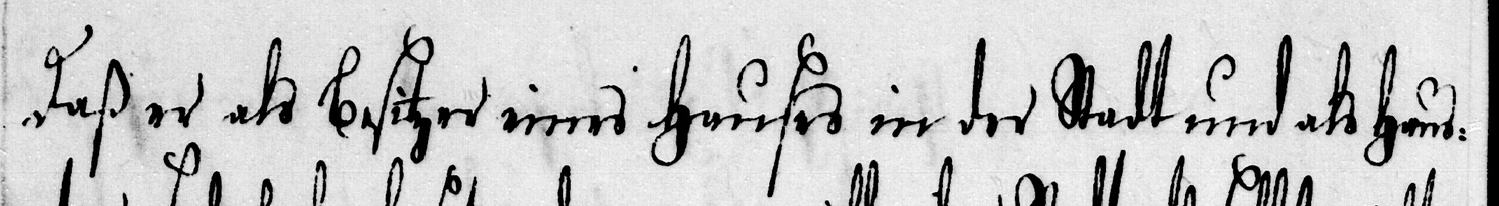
Daß er als Besitzer eines Hauses in der Stadt und als Haus¬
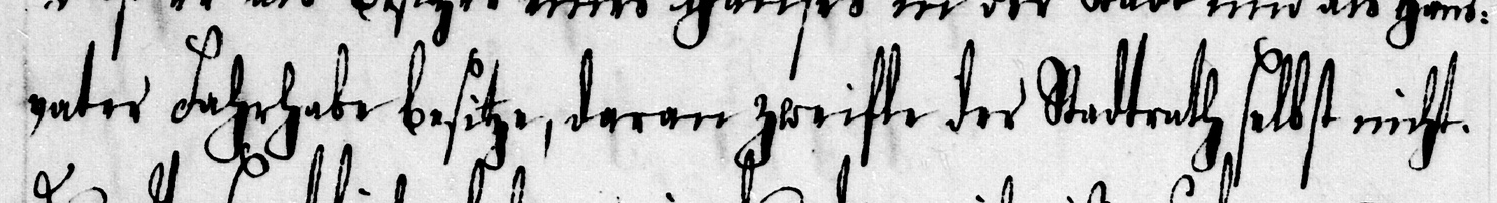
vater Fahrhabe besitze, daran zweifle der Stadtrath selbst
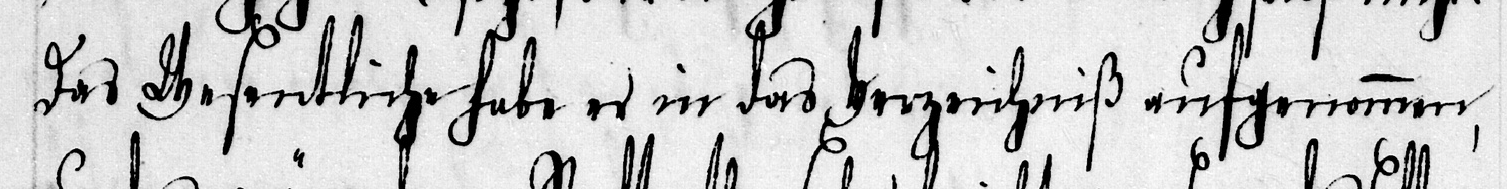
Das Wesentliche habe er in das Verzeichniß aufgenommen,
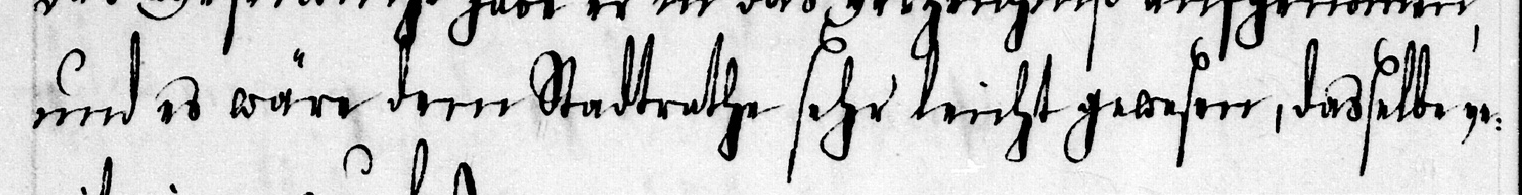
und es wäre dem Stadtrathe sehr leicht gewesen, dasselbe
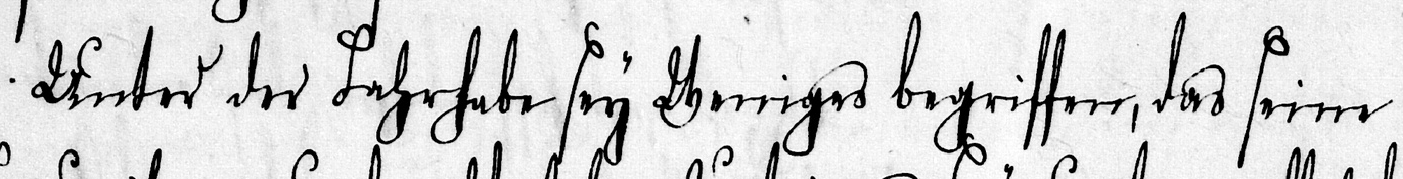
Unter der Fahrhabe sey Weniges begriffen, das seine
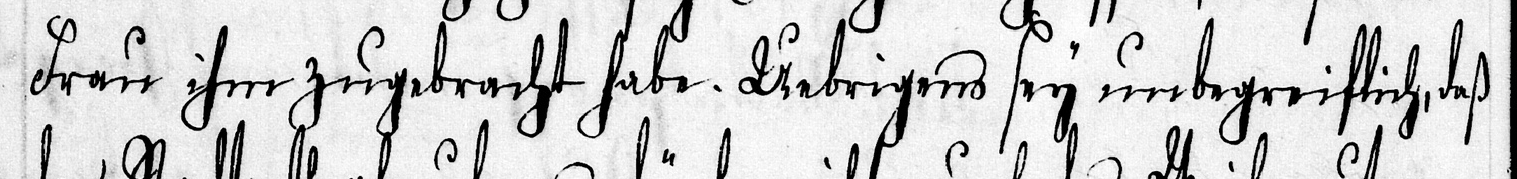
Frau ihm zugebracht habe. Uebrigens sey unbegreiflich, daß
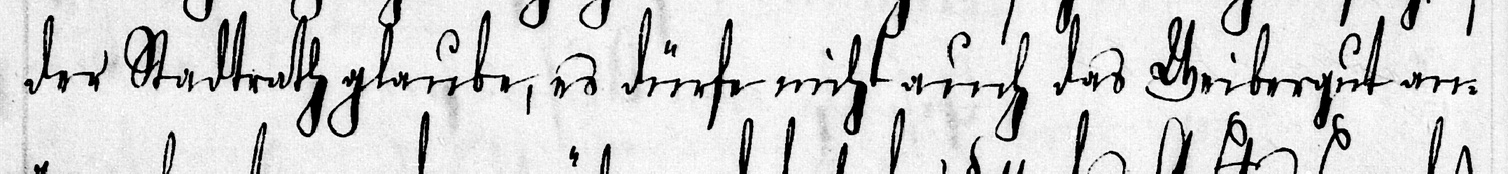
der Stadtrath glaube, es dürfe nicht auch das Weibergut an¬
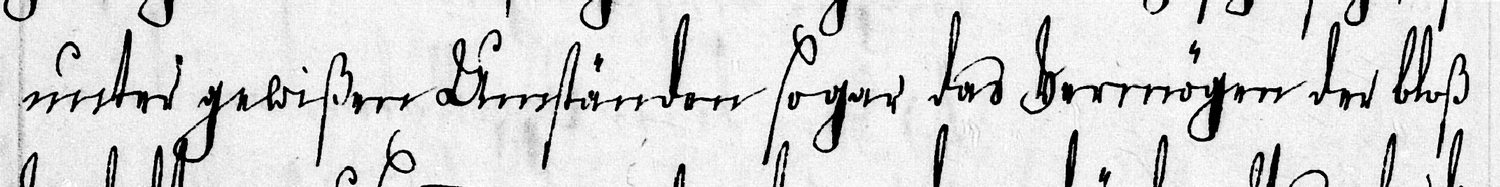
unter gewißen Umständen sogar das Vermögen der bloß
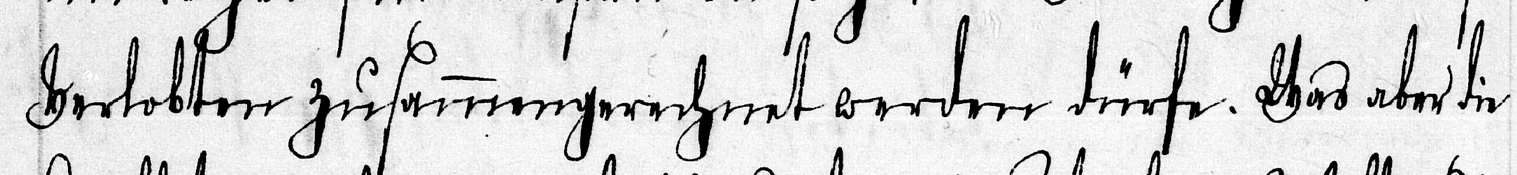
Verlobten zusammengerechnet werden dürfe. Was aber die
